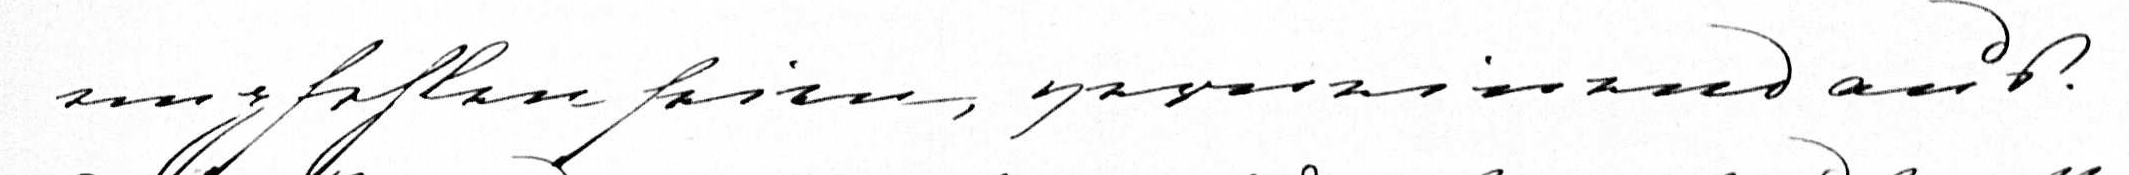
empfehlen seien, verneinend aus.
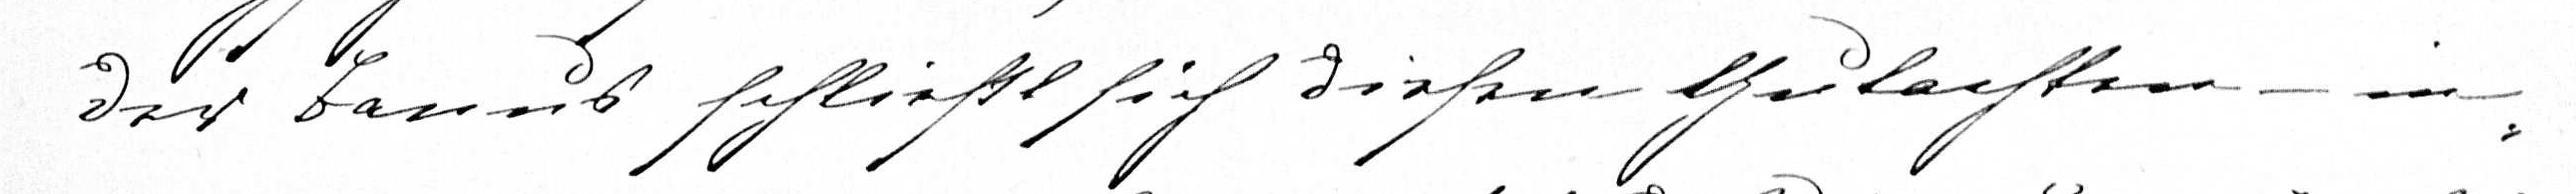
Der Banus schließt sich diesen Gutachten in¬
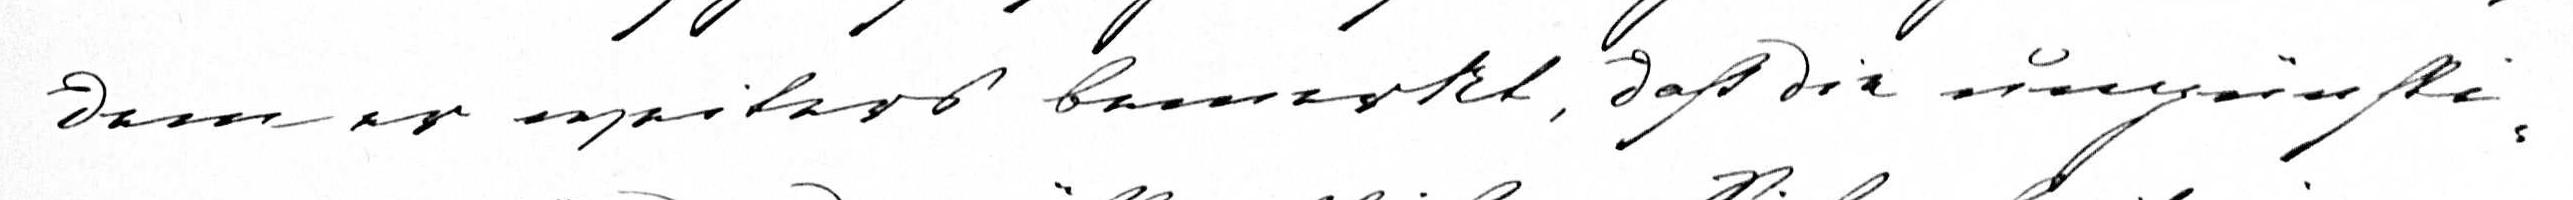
dem er weiters bemekrt, daß die ungünsti¬
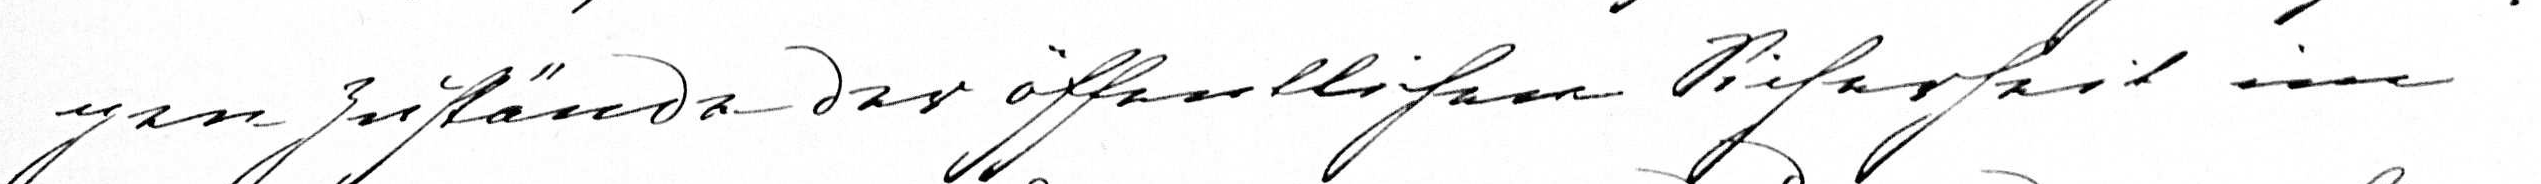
gen Zustände der öffentlichen Sicherheit im
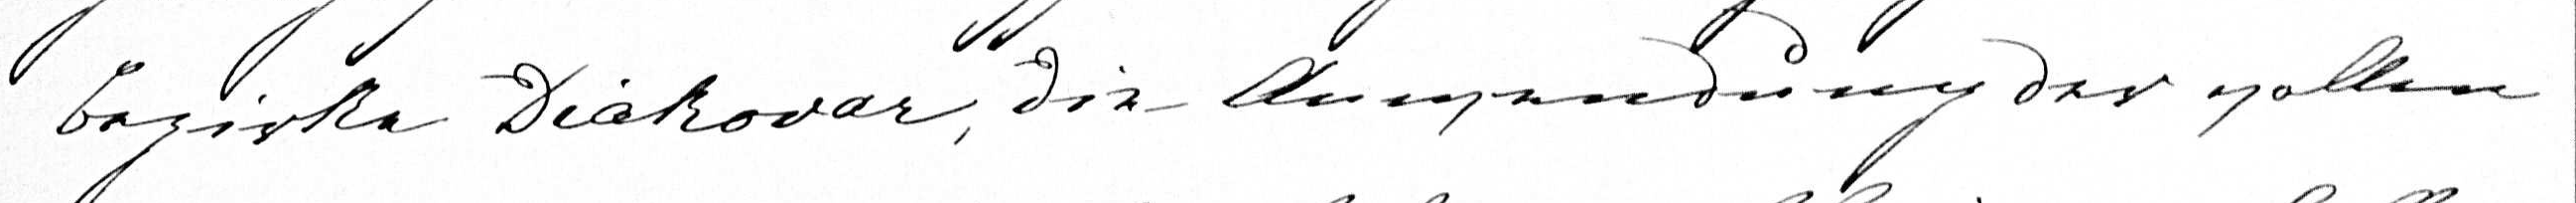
Bezirke Diakovar, die Anwendung der vollen
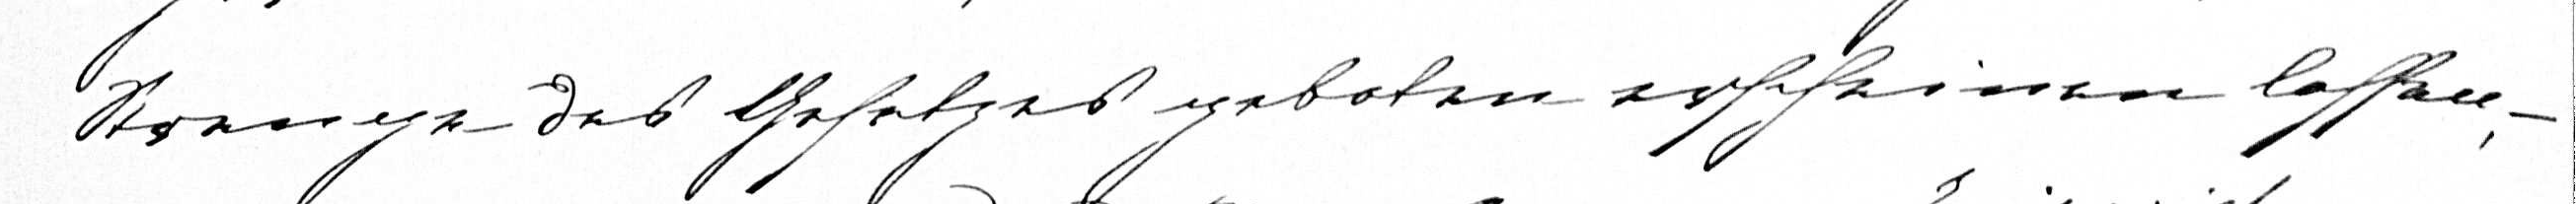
Strenge des Gesetzes geboten erscheinen lassen,
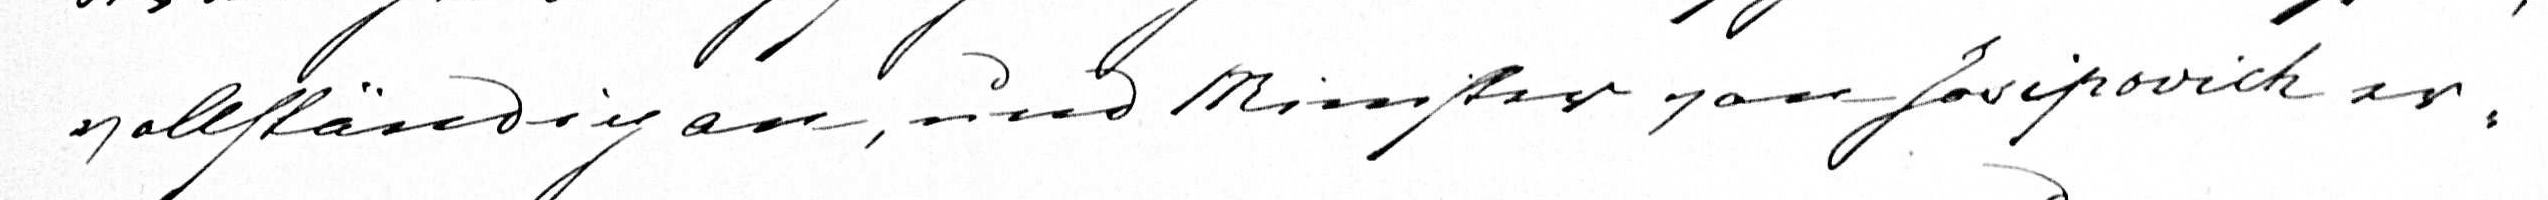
vollständig an, und Minister von Josipovich er¬
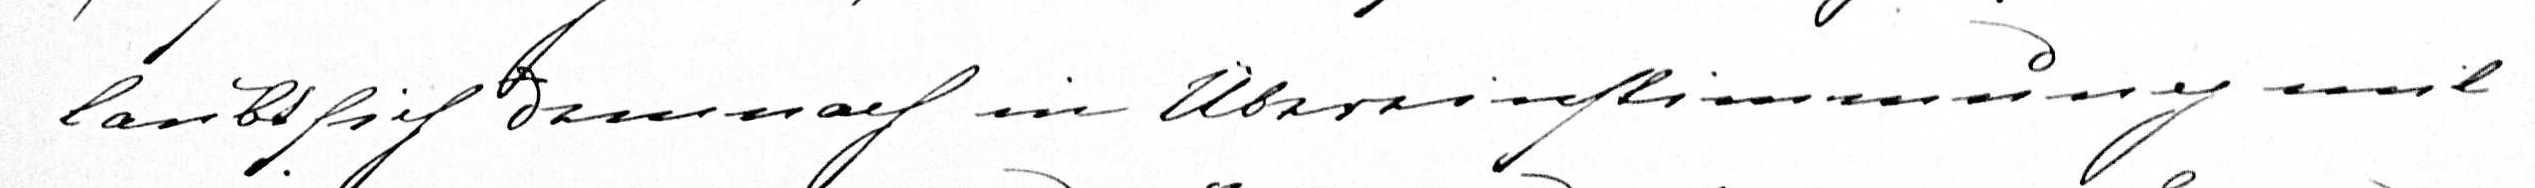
laubt sich demnach in Überreinstimmung mit
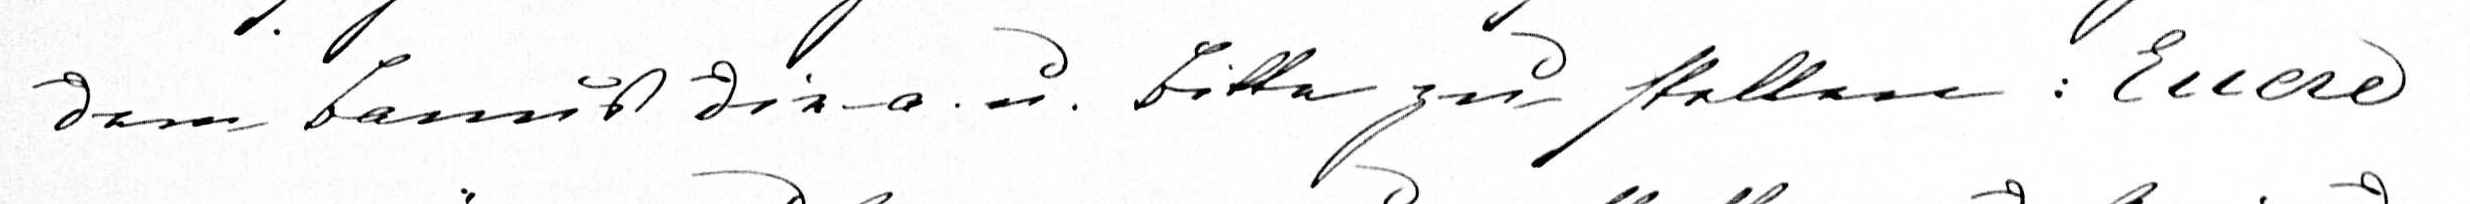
dem Banus die a.u. Bitte zu stellen: Euere
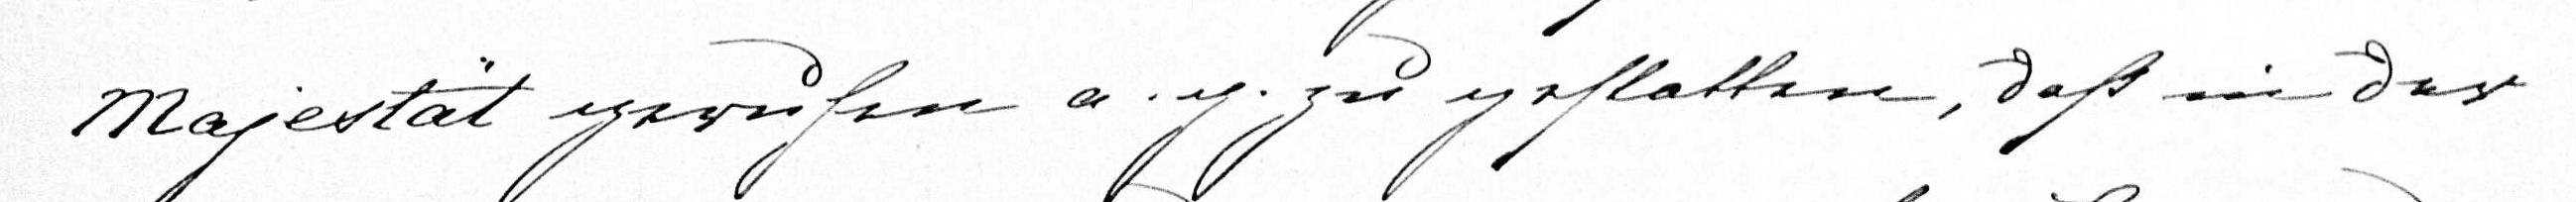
Majestät geruhen a.g. zu gestatten, daß in der
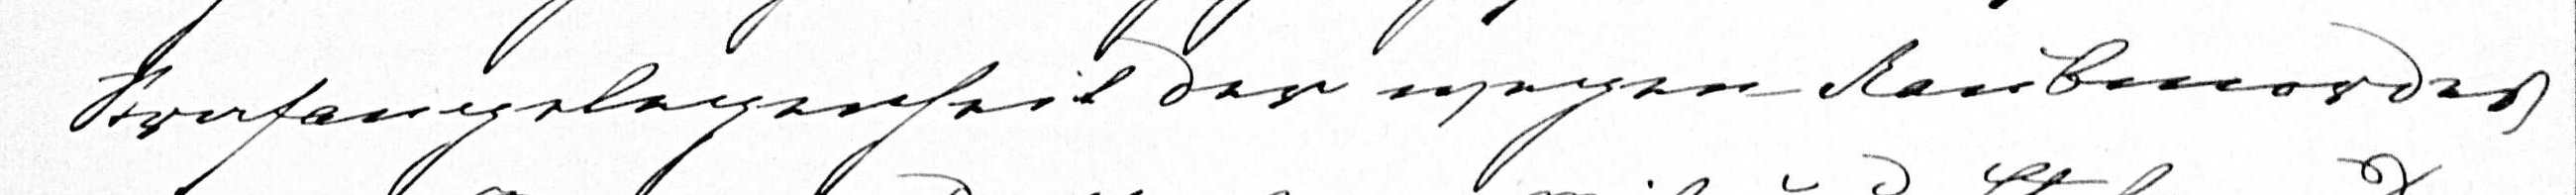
Strafangelegenheit der wegen Raubmordes
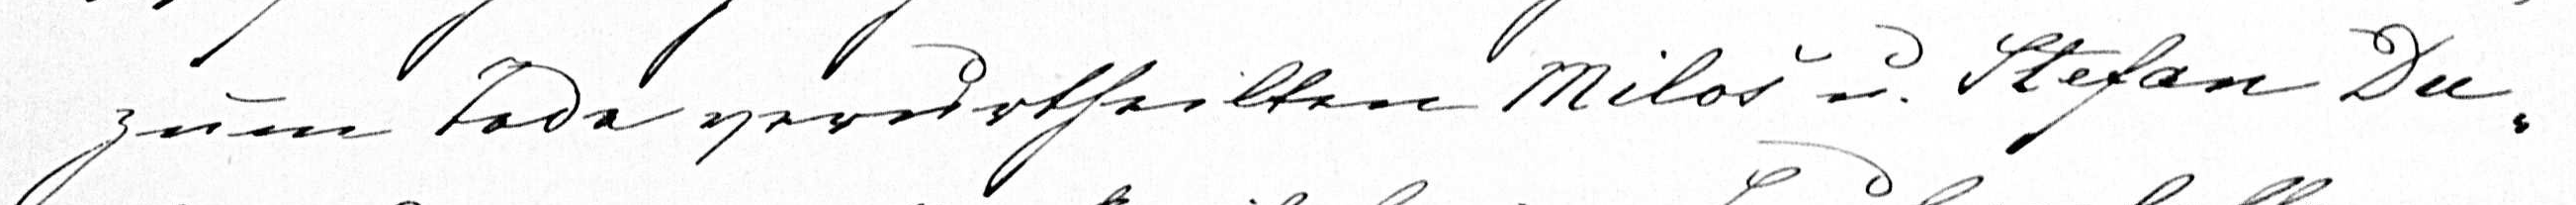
zum Tode verurtheilten Miloš u. Stefan Du¬
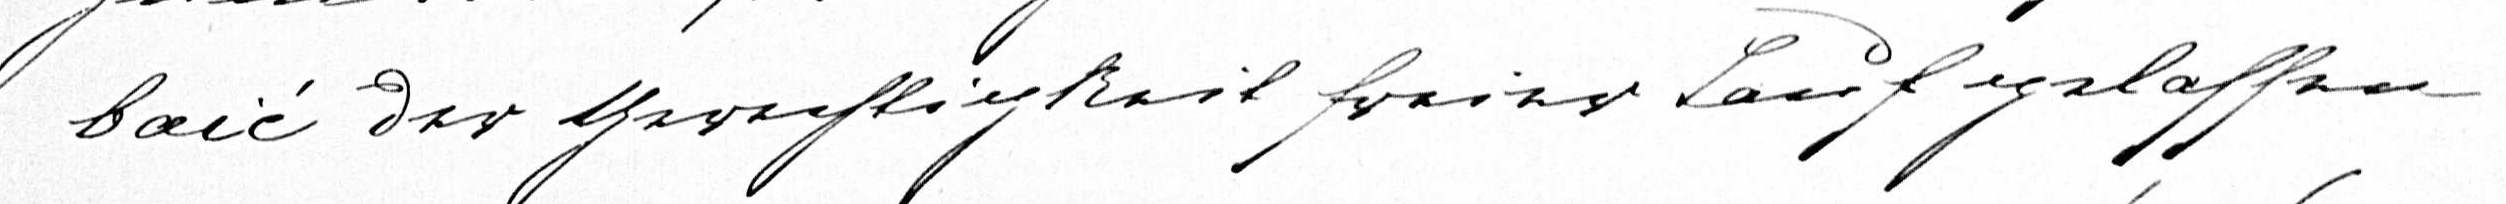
baić der Gerechtigkeit freier Lauf gelassen
